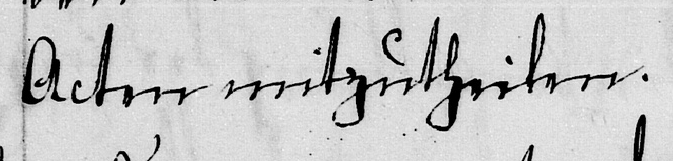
Acten mitzutheilen.
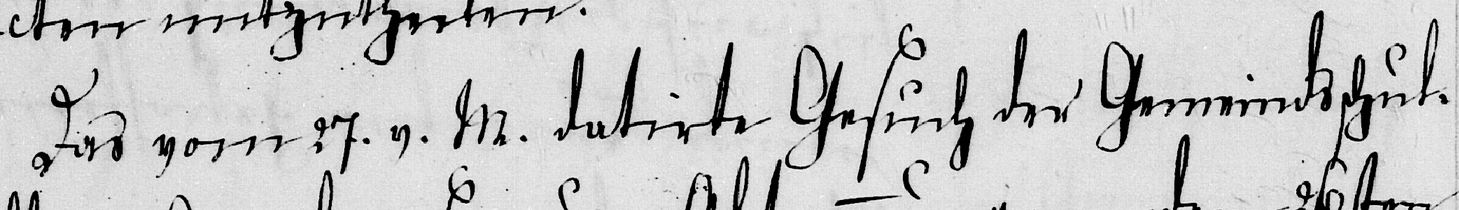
Das vom 27. v. M. datirte Gesuch der Gemeindsschu¬
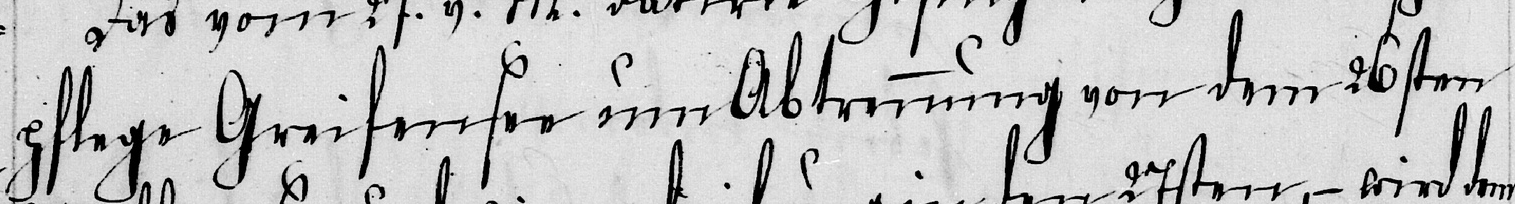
lpflege Greifensee um Abtrennung von dem 26sten
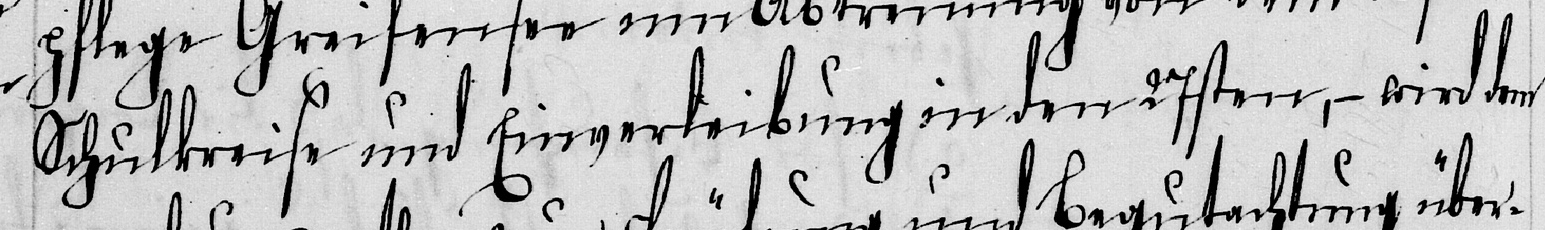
Schulkreise und Einverleibung in den 27sten, – wird dem
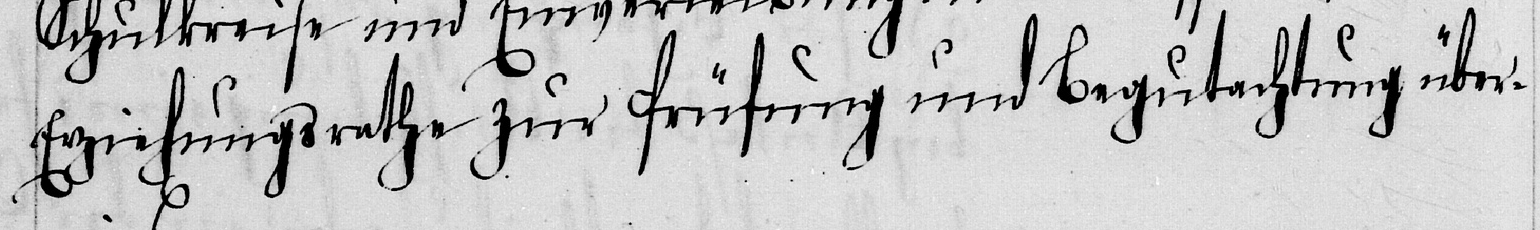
Erziehungsrathe zur Prüfung und Begutachtung über¬
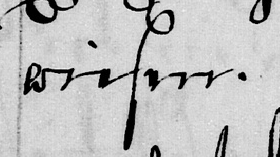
wiesen.
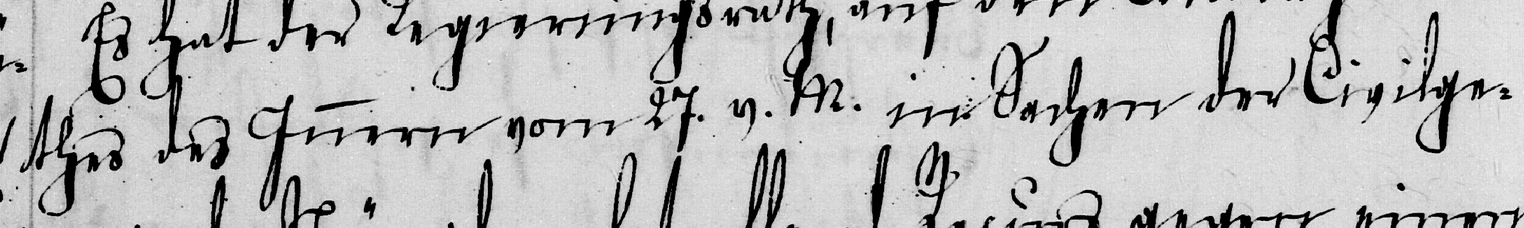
thes des Innern vom 27. v. M. in Sachen der Civilge¬
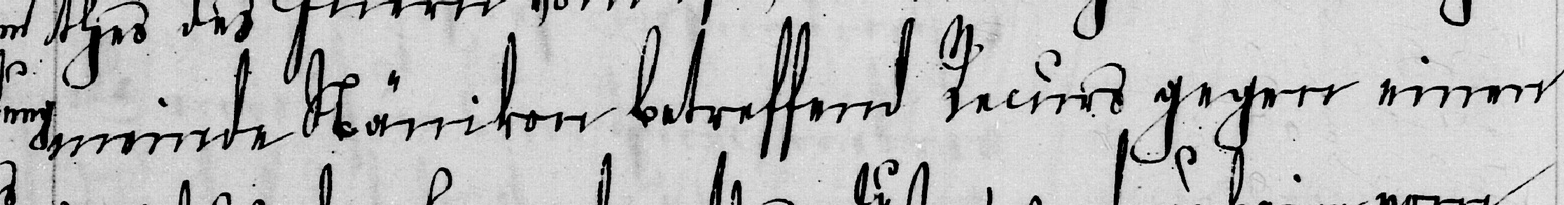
meinde Nänikon betreffend Recurs gegen einen
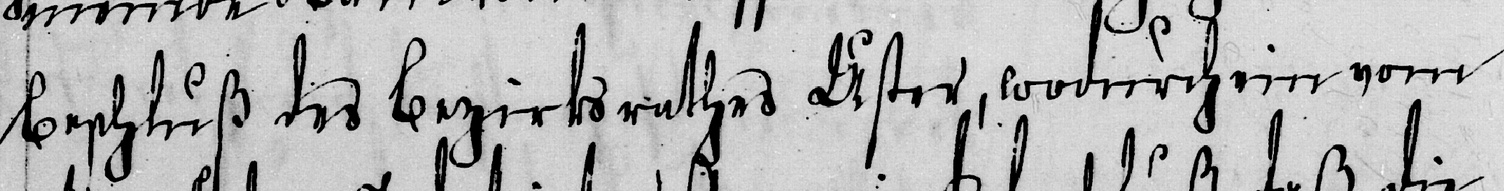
Beschluß des Bezirksrathes Uster, wodurch ein vom
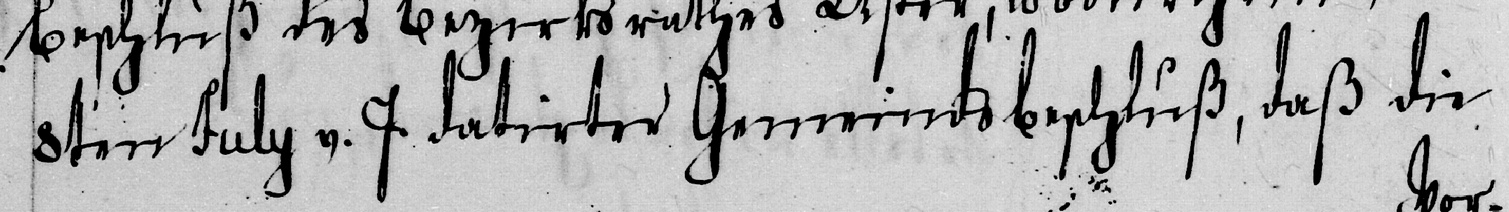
8ten July v. J datirter Gemeindsbeschluß, daß die
